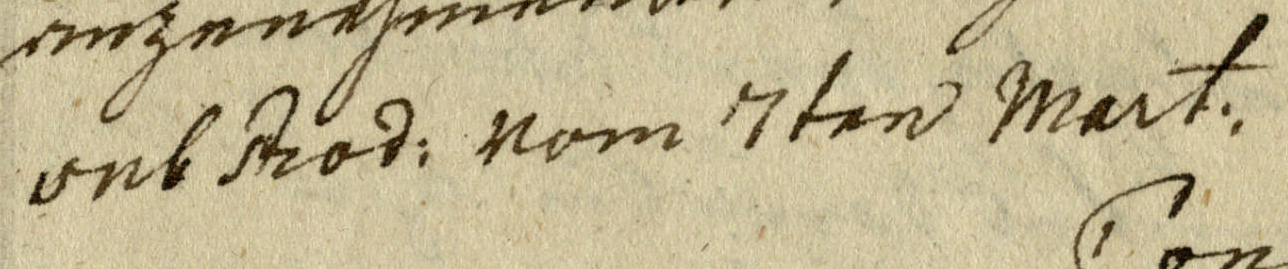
sub. Prod. vom 7. Mart.
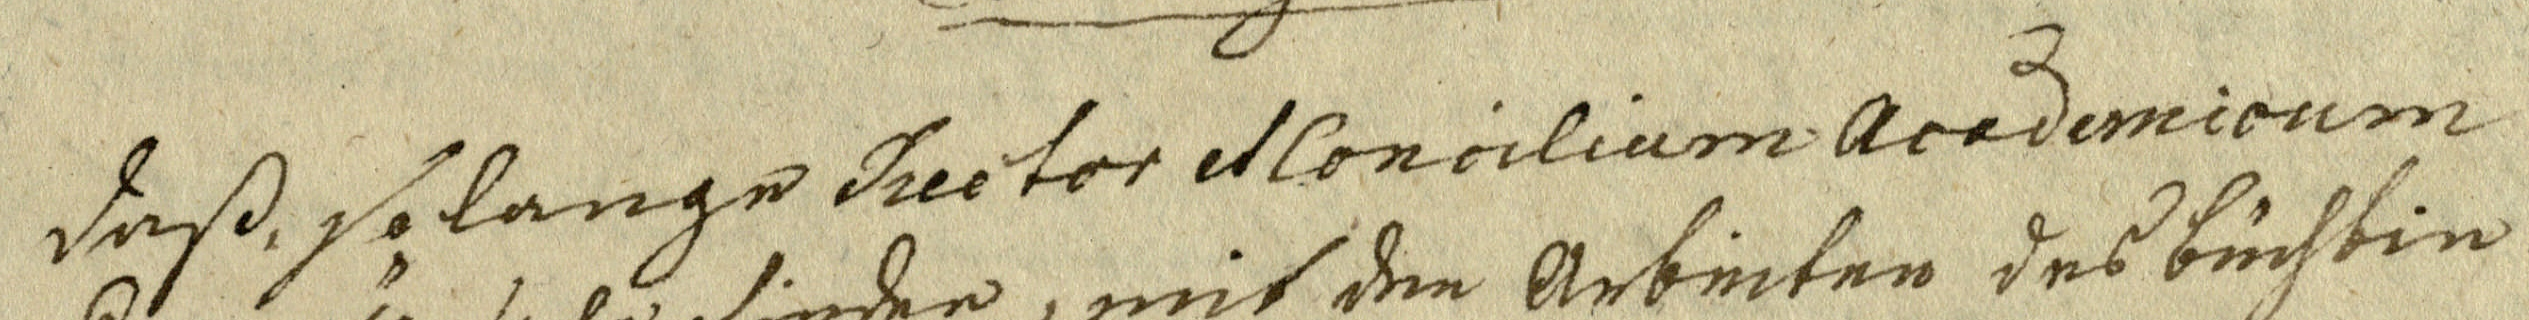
daß, solange Rector et Concilium Academicum
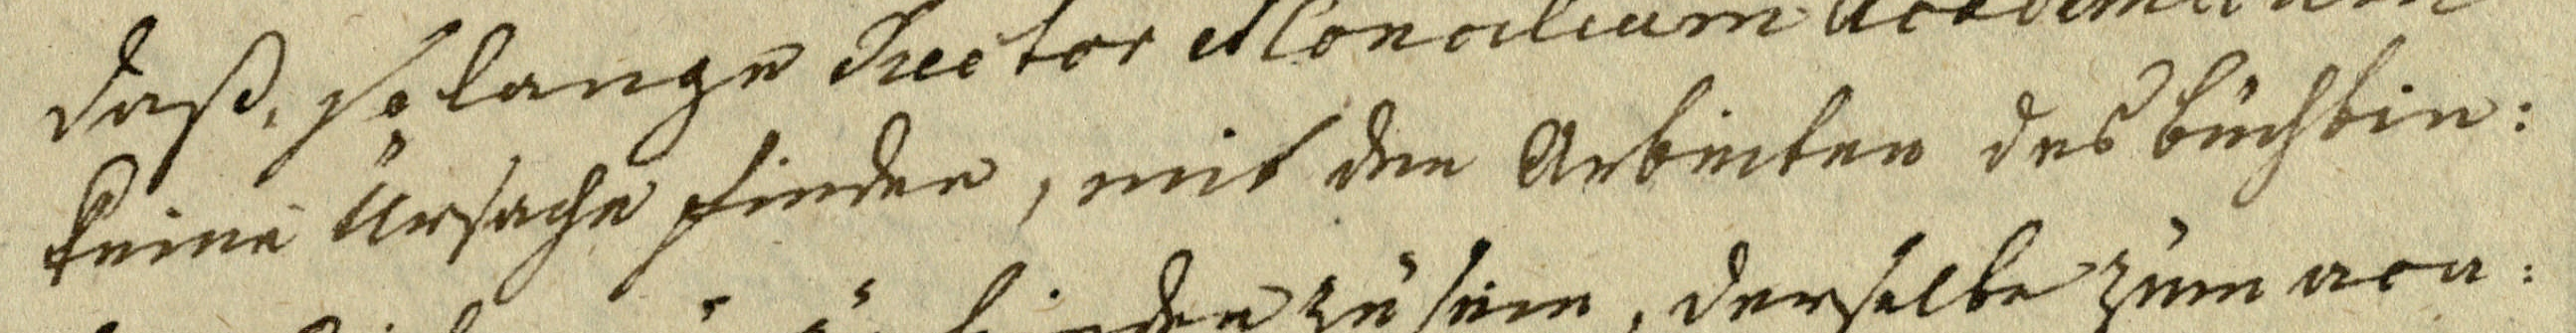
keine Ursache finden, mit dem Arbeiten des Buchbin¬
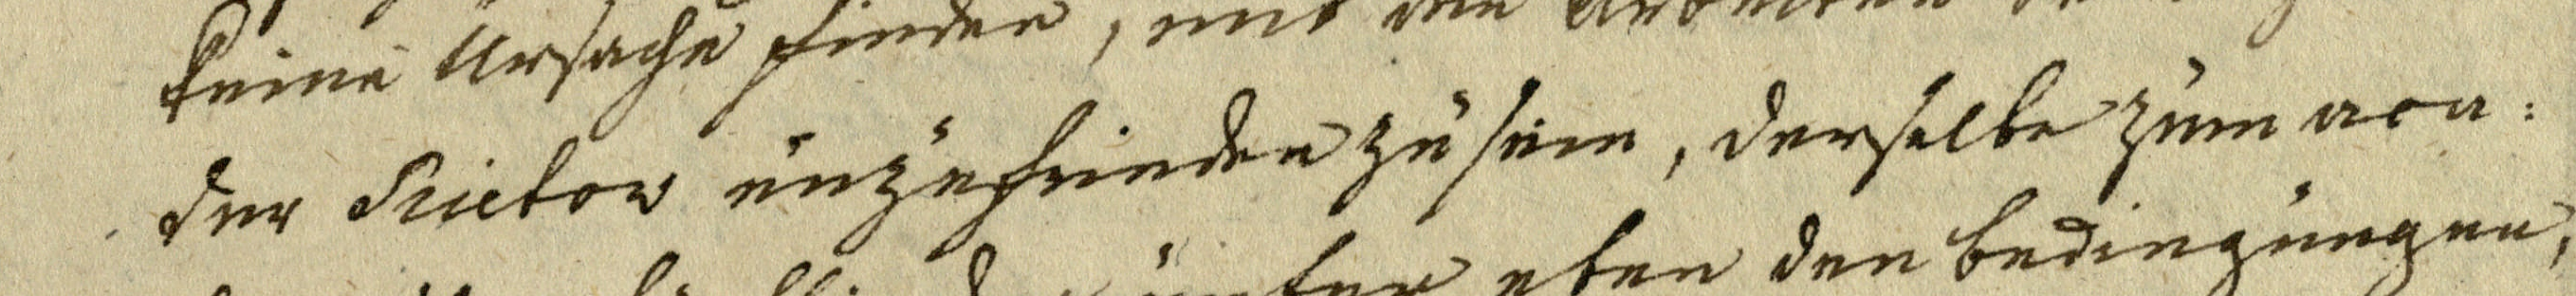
Rietow unzufrieden zu sein,derselbe zum aca¬
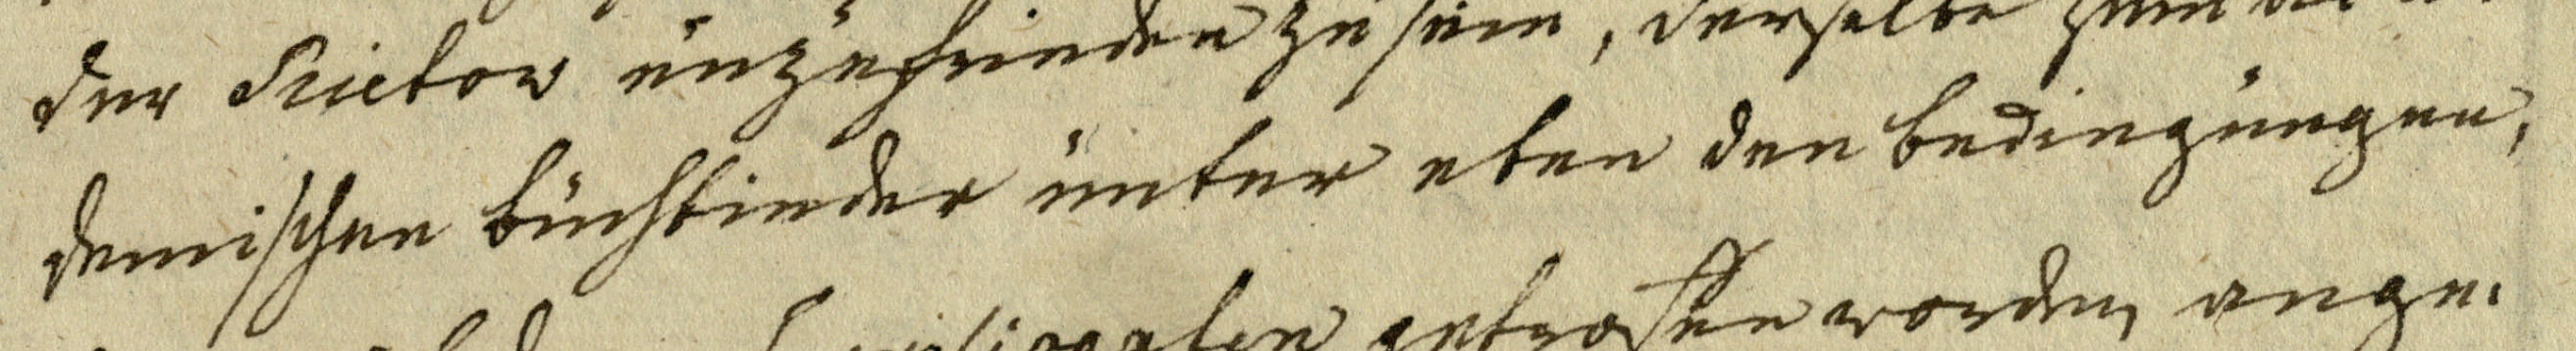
demischen Buchbinder unter eben den Bedingungen,
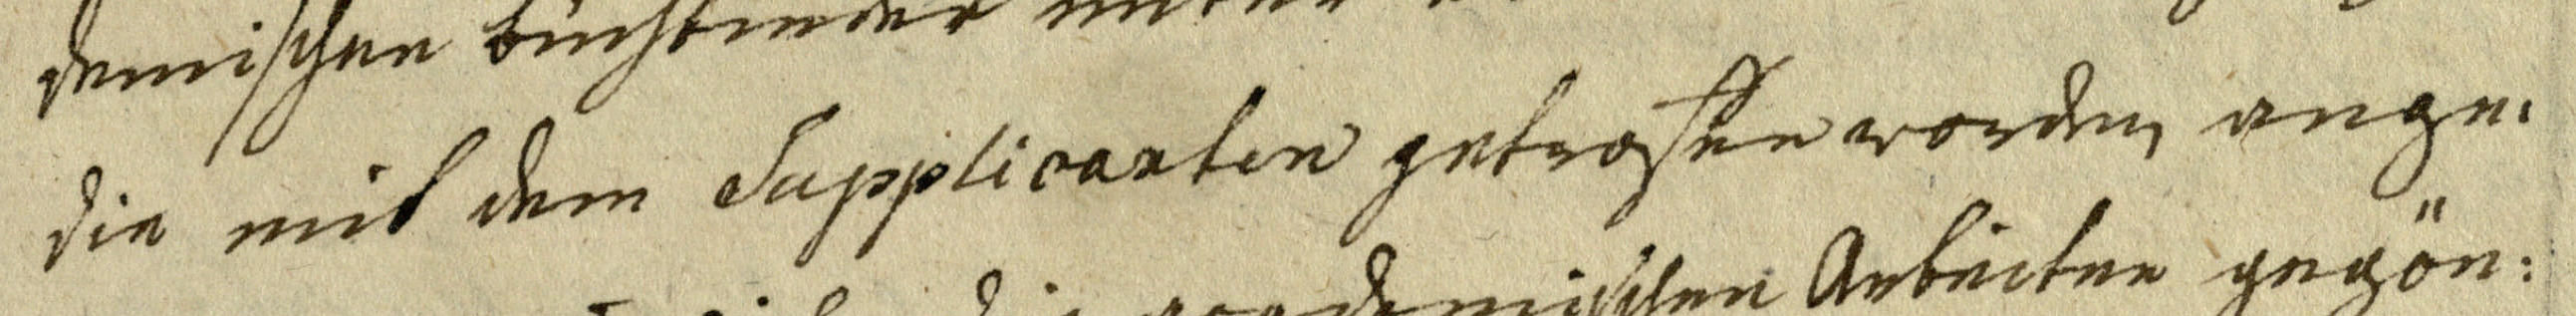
die mit dem Supplicanten getroffen worden, ange¬
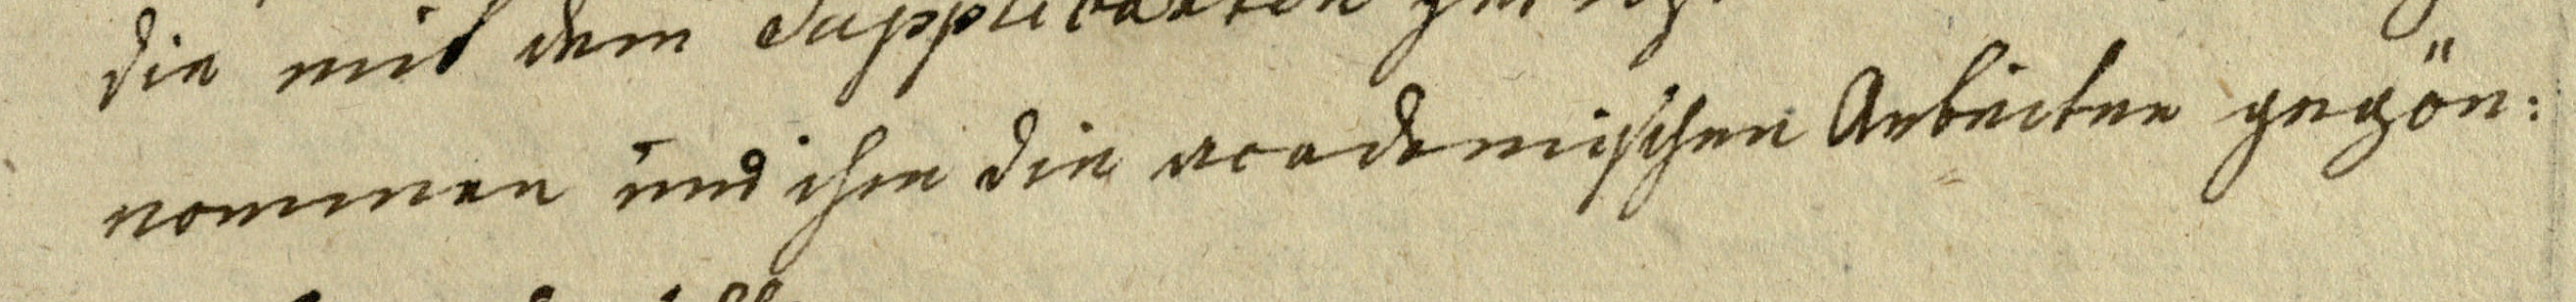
nommen und ihm die academischen Arbeiten gegön¬
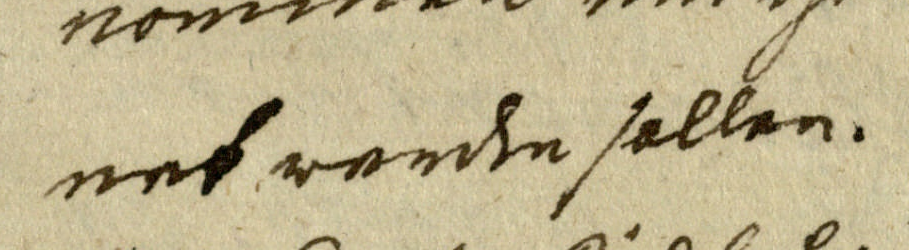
net werden sollen.
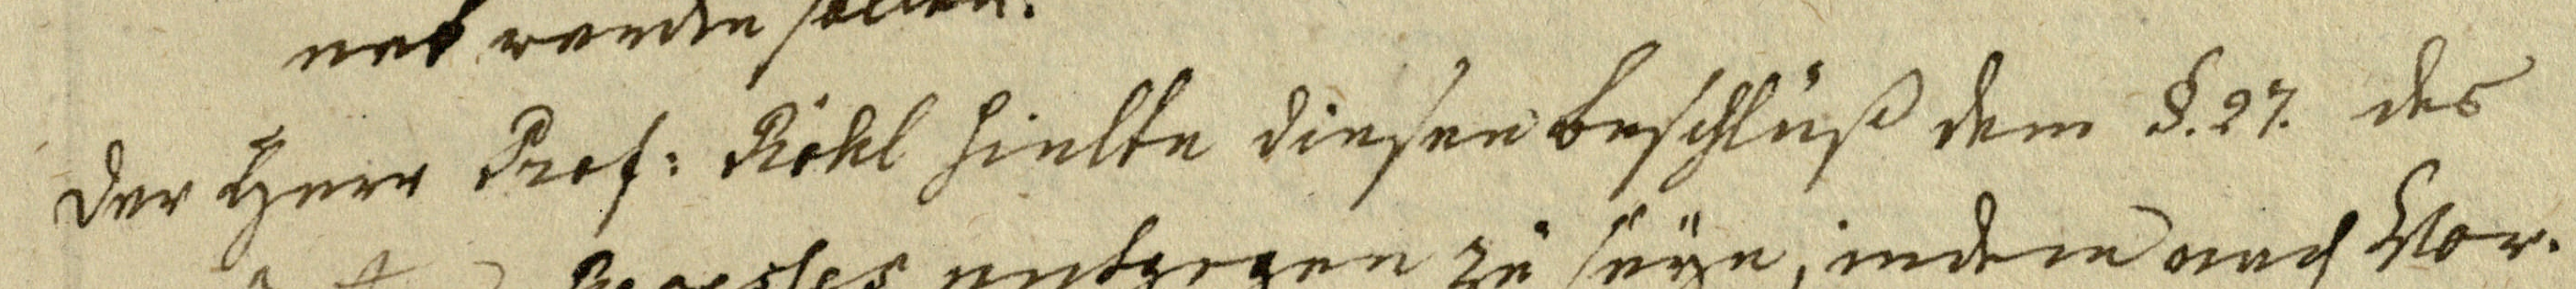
Der Herr Prof.Röhl hielte diesen Beschluß dem § 27. des
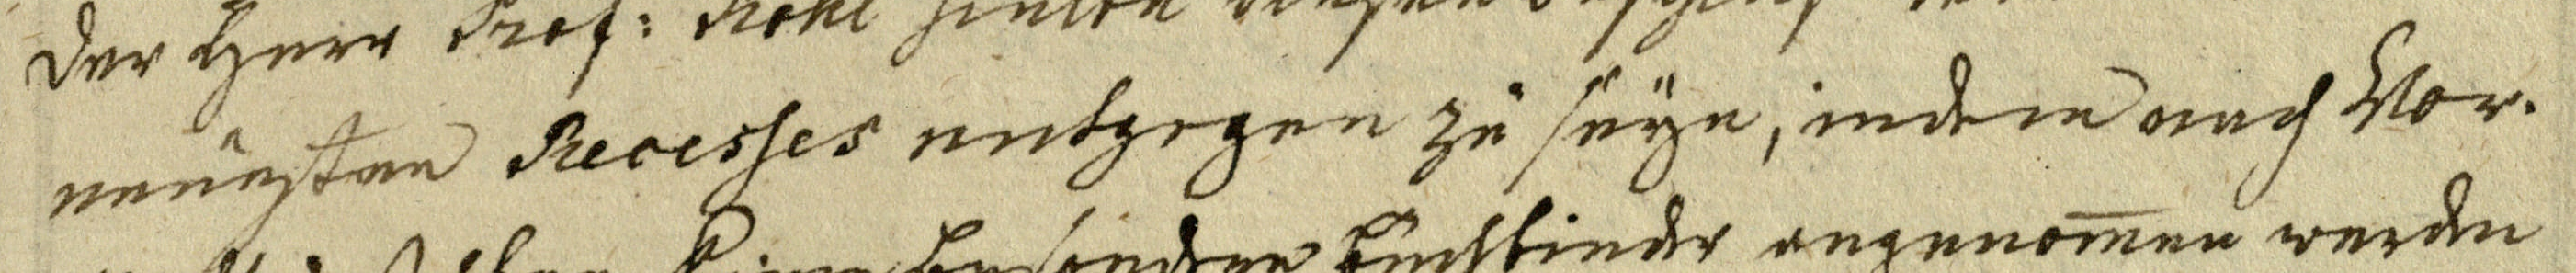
neuesten Recesses entgegen zu seÿn, indem nach Vor¬
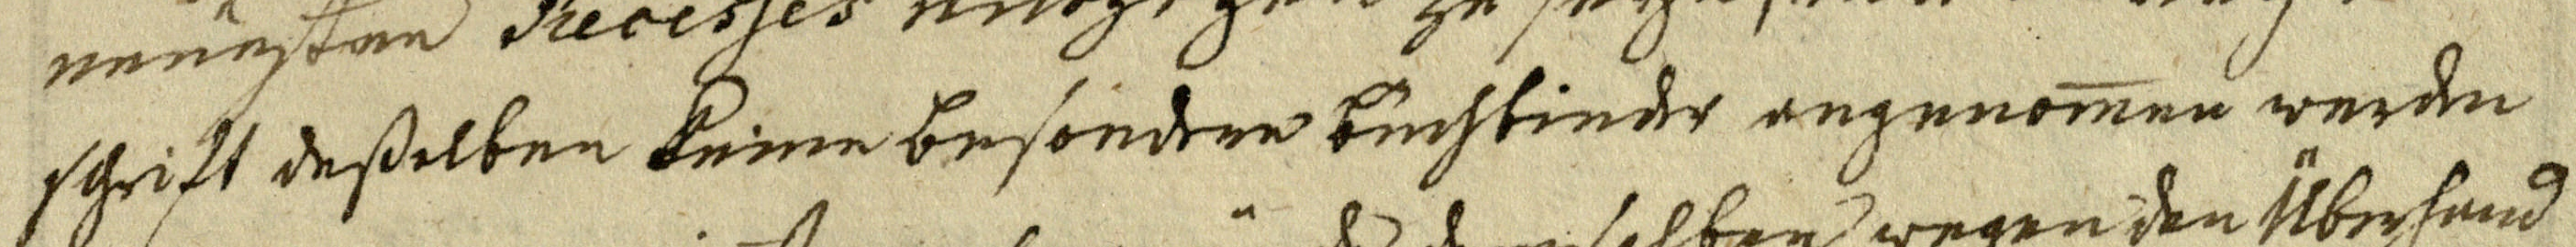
schrift desselben keine besondere Buchbinder angenomen werden
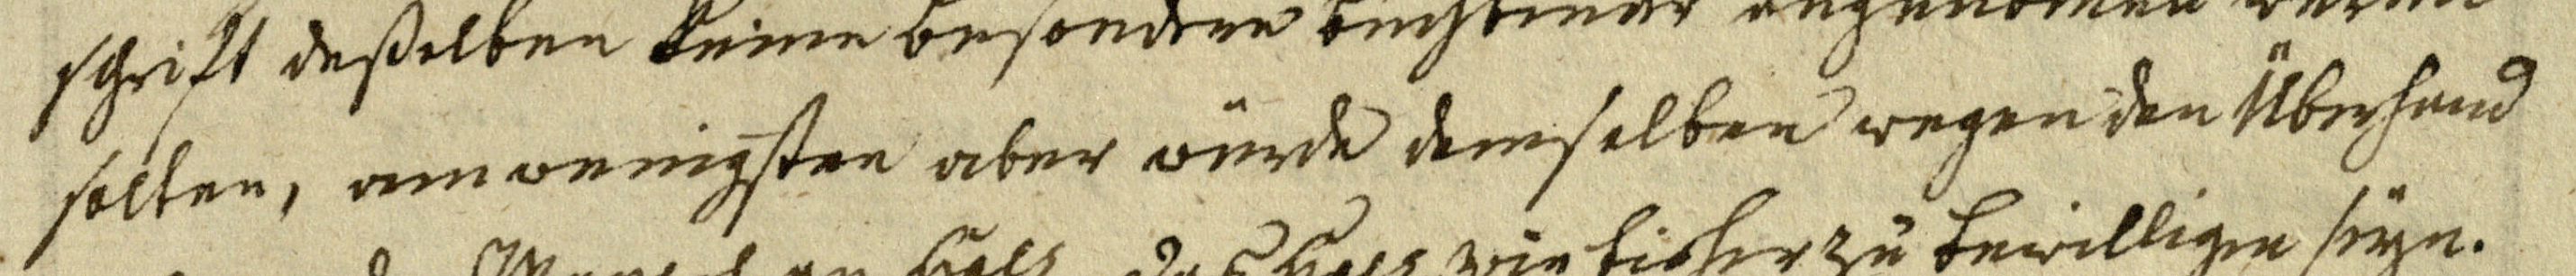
solten, am wenigsten aber würde demselben wegen den Überhand
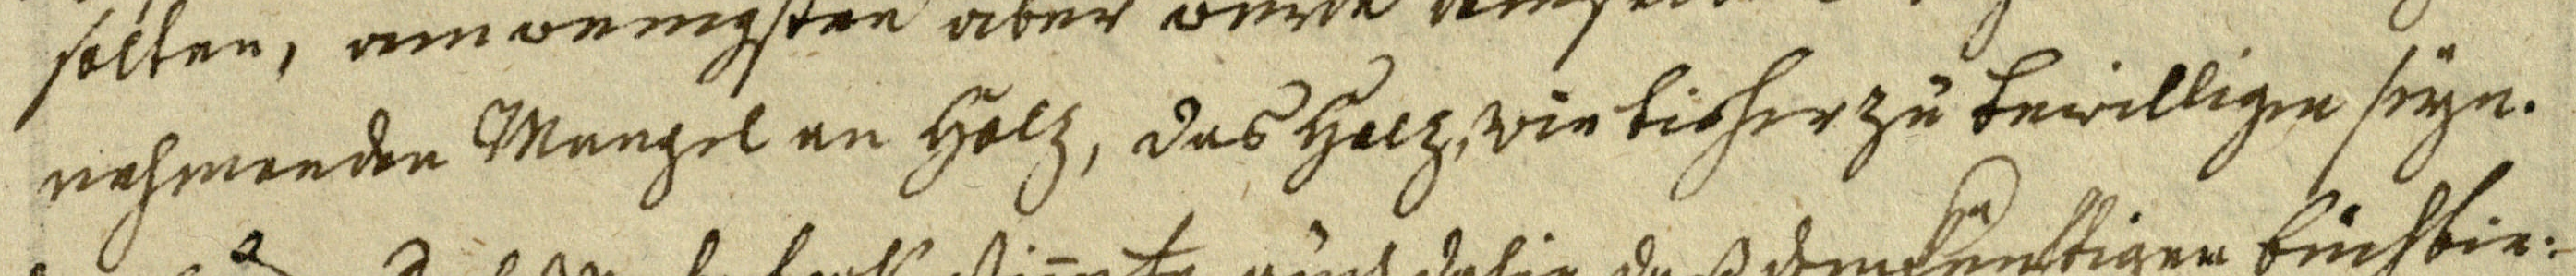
nehmenden Mangel an Holz, das Holz, wie bisher zu bewiliigen seÿn.
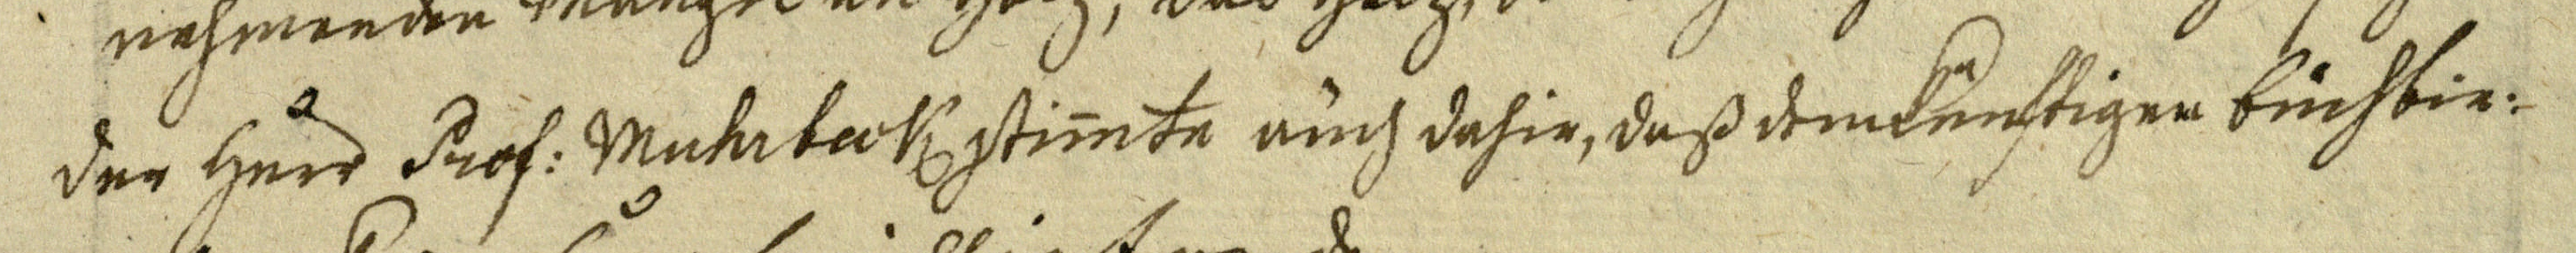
Der Herr Prof. Muhbeck stimte auch dahin, daß dem künftigen Buchbin¬
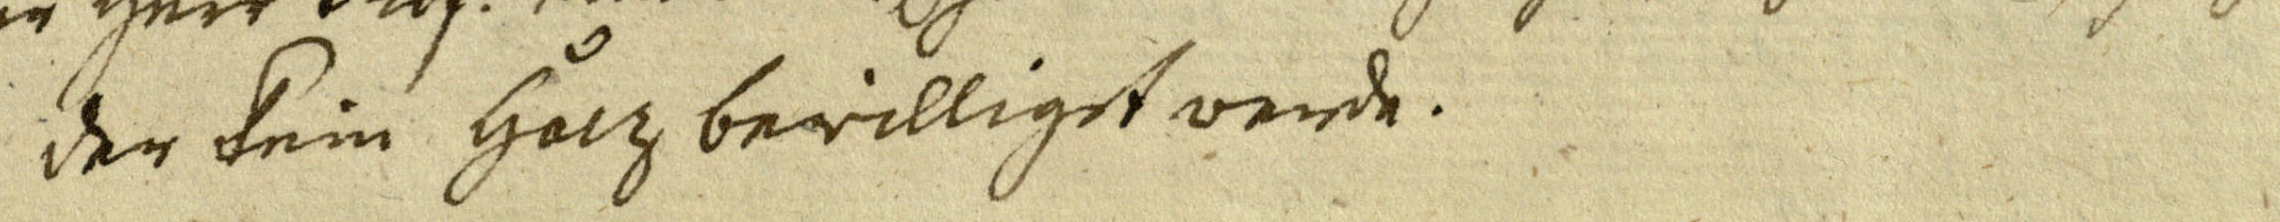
der kein Holz bewilliget werde.
